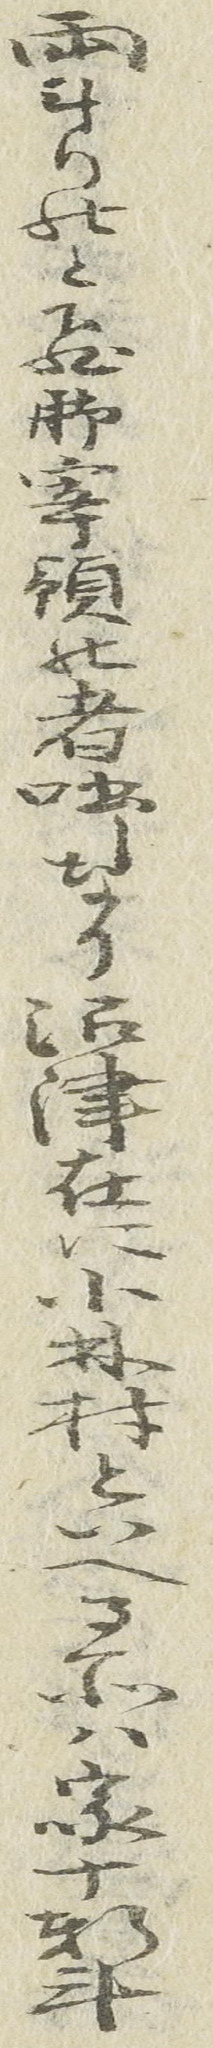両斗りのと飛脚宰領の者咄しなり沼津在に小林村といへる所は家十軒斗
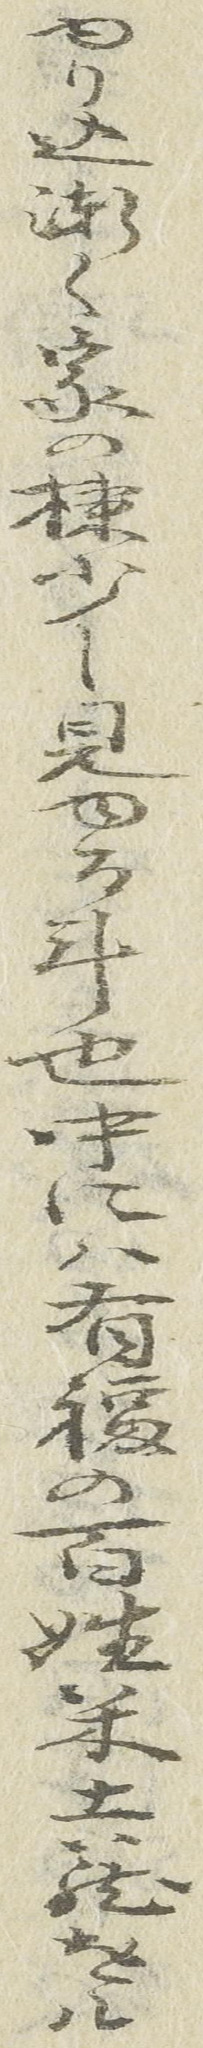ゆり込漸く家の棟少し見ゆる斗也中には有福の百姓米土蔵をも
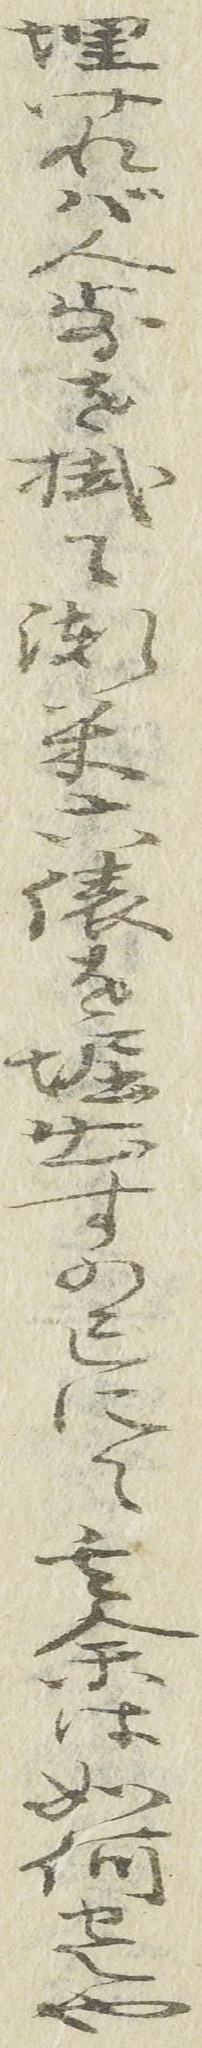埋ければ人歩を掛て漸米六俵を掘出すのみにて其余は如何せしや
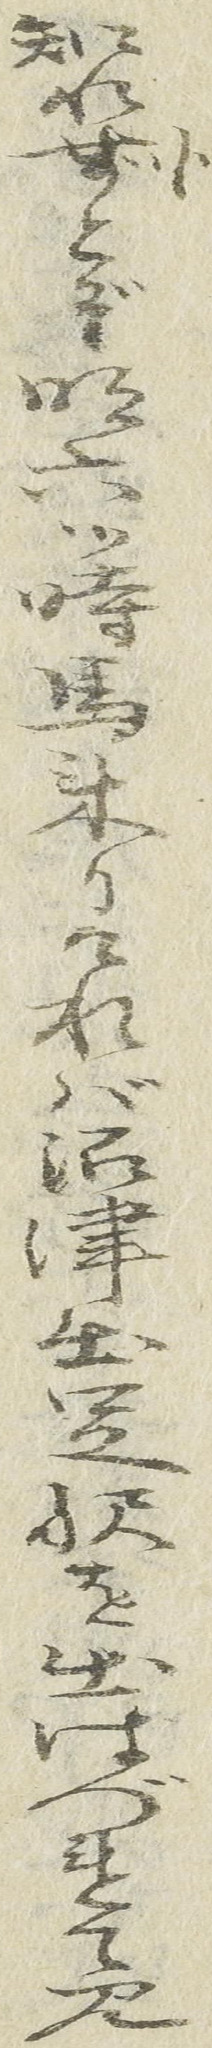知れじとぞ明六ツ時馬来りければ沼津出足駅を出はづれて見
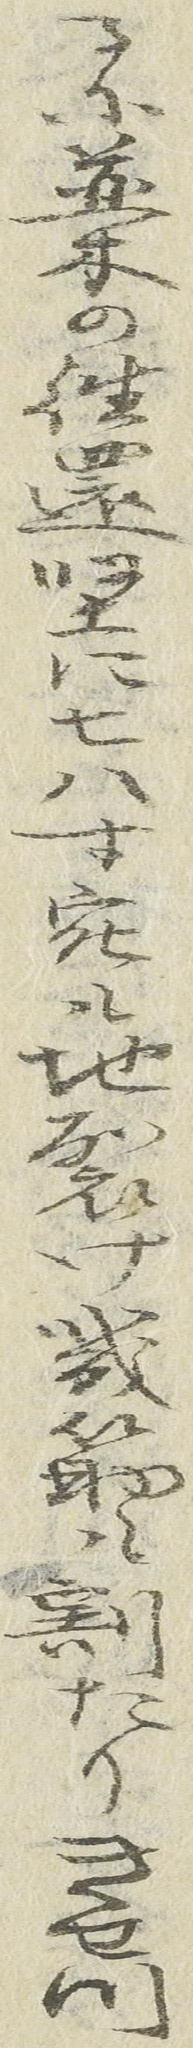るに並木の往還堅に七八寸宛も地裂け幾筋も割たりきセ川
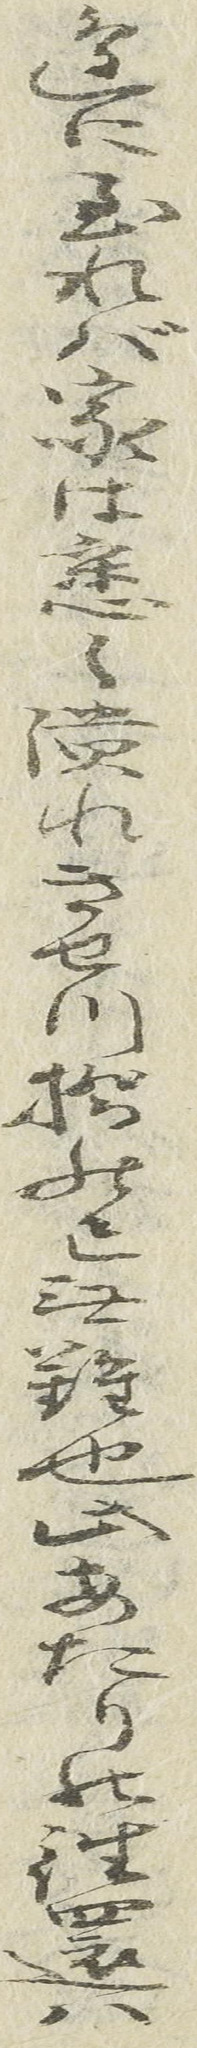辺に至れば家は悉く潰れきセ川橋のみ無難也此あたりの往還は

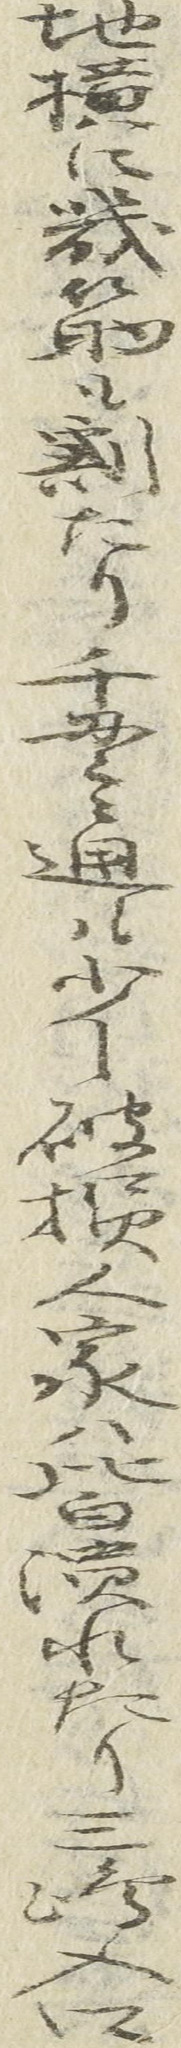地横に幾筋も裂たり千貫通も少し破損人家ハ皆潰れたり三嶋入口
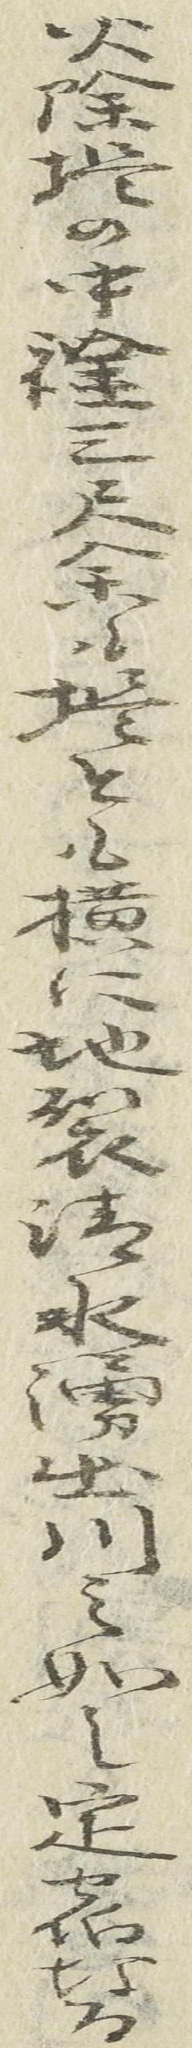火除堤の中程三尺余も堤とも横に地裂清水湧出川之如し定宿なる
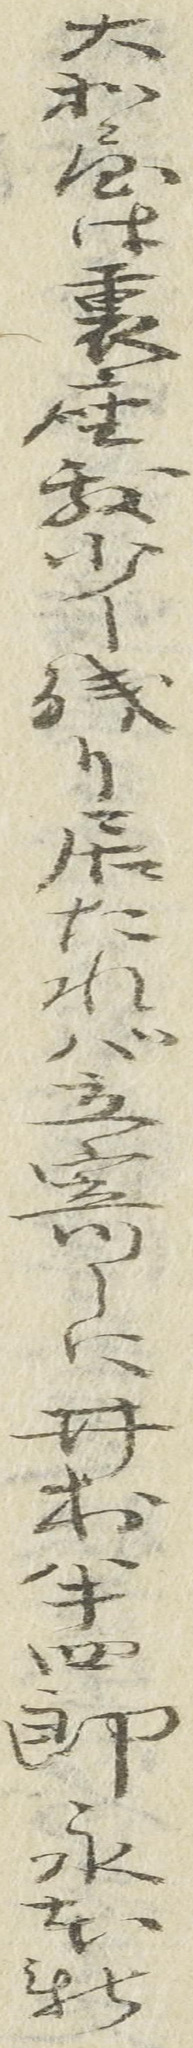大和屋は裏座敷少し残り居たれバ立寄しに井村半四郎永本新
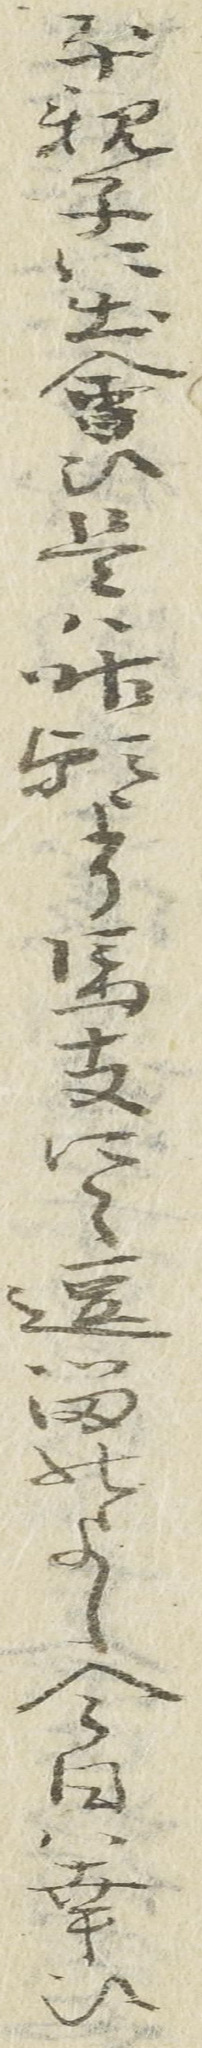平親子に出会ひ是ハ昨朝より馬支にて逗留のよし今日ハ幸ひ
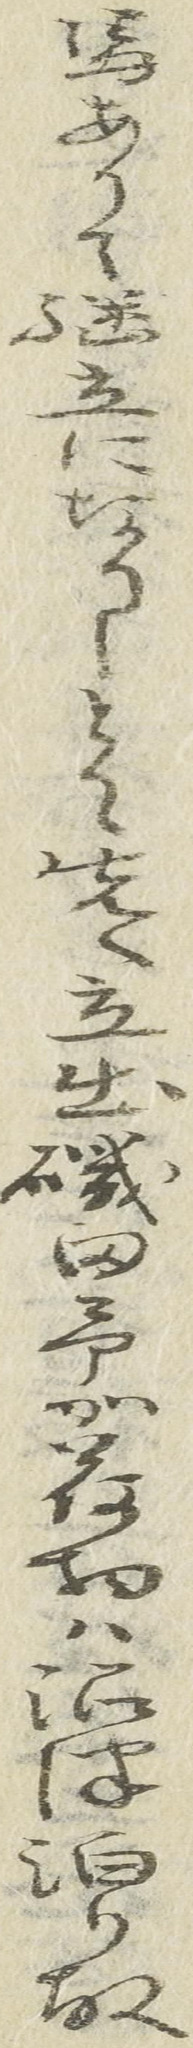馬ありて継立になりしとて先へ立出磯田予が荷物ハ沼津泊り故
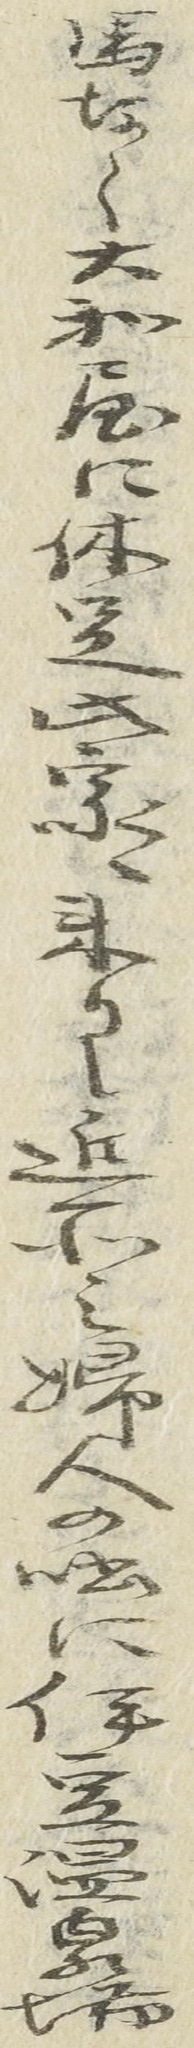馬なく大和屋に休足此家へ来りし近所之婦人の咄に伊豆温泉場
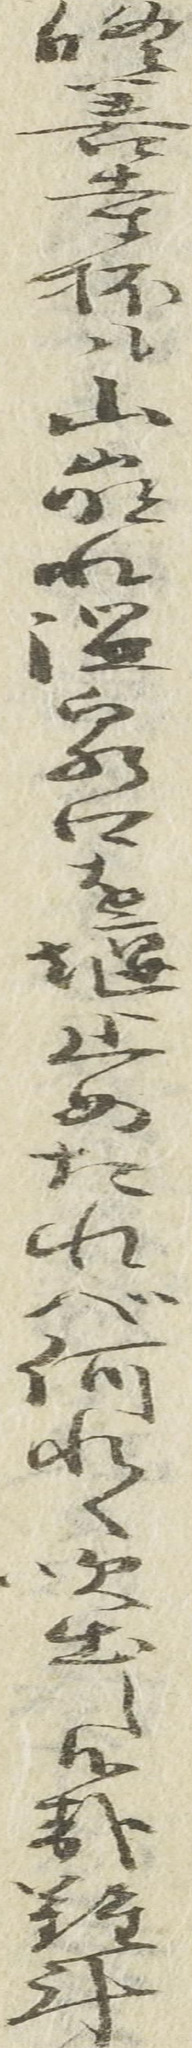修善寺抔も山崩れ温泉口を堰止めたれバ何れへ吹出し候哉難斗
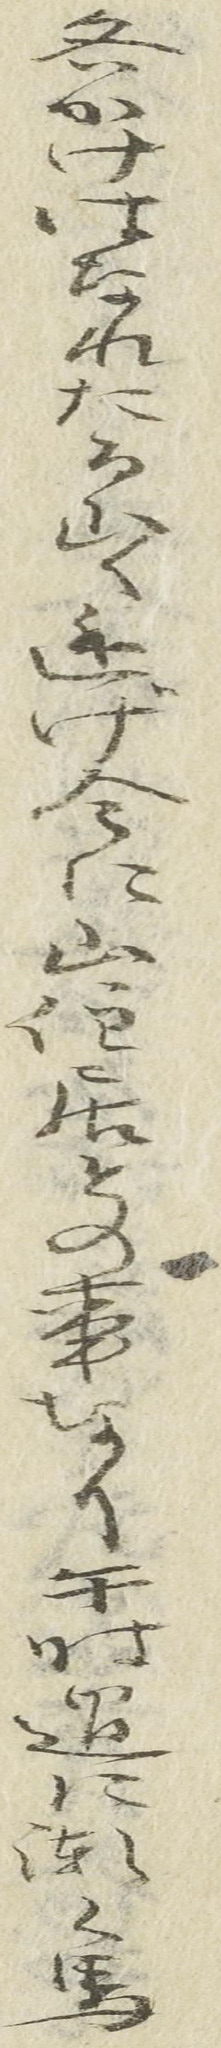各かけはなれたる山へ逃げ今に山住居との事なり午時過に漸く馬
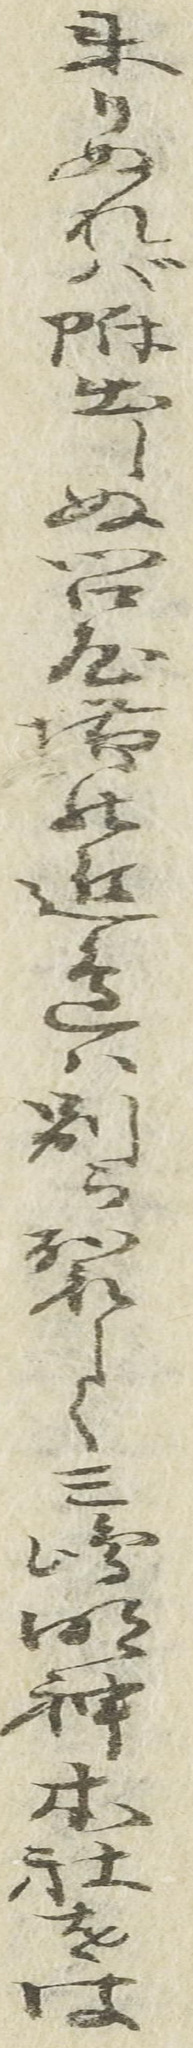来りぬれバ附出しぬ問屋場の近邊ハ別ら裂しく三嶋明神本社をは
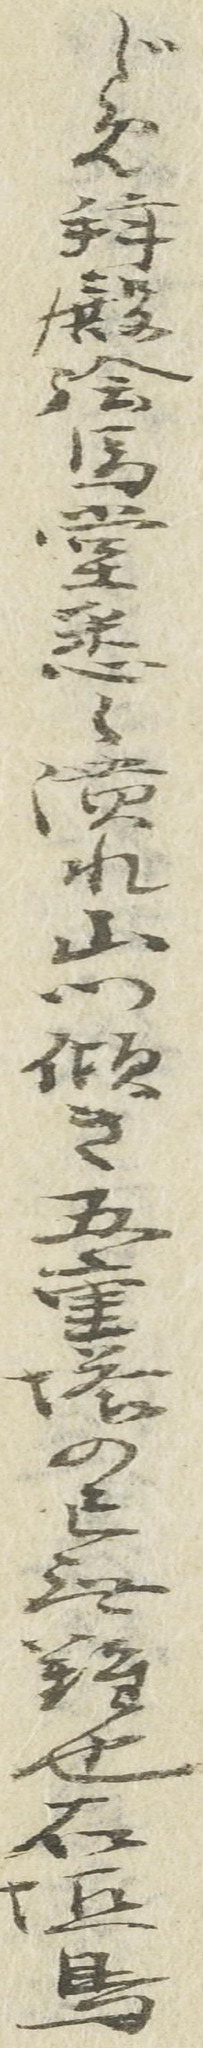じめ拝殿絵馬堂悉く潰れ山門傾き五重塔のみ無難也石垣鳥
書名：地震前兆集　全
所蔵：東京大学地震研究所図書室 Earthquake Research Institute Library, The University of Tokyo, JAPAN
